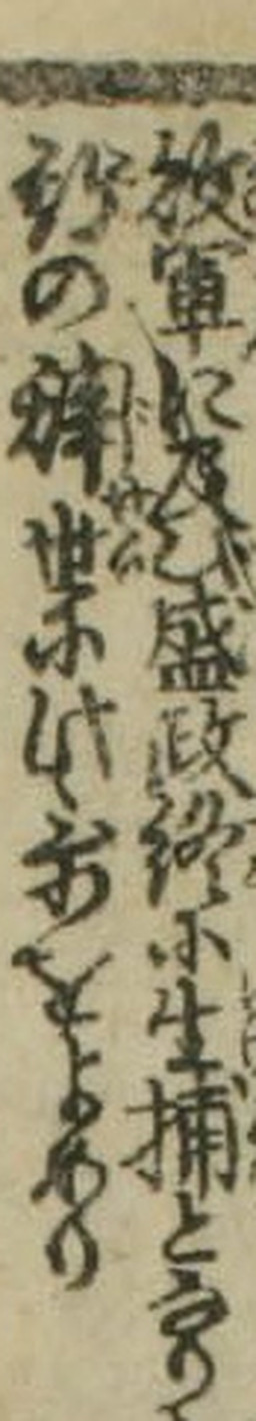期の辞世に此哥をよめり
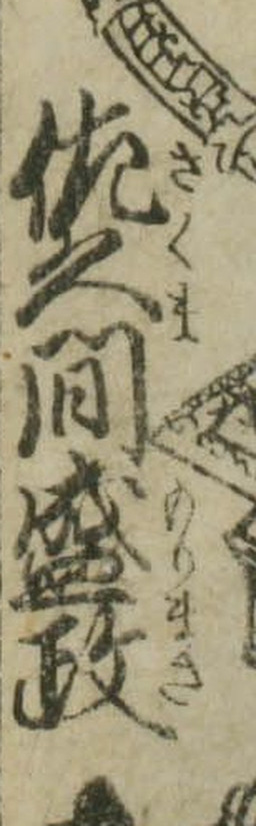佐久間盛政
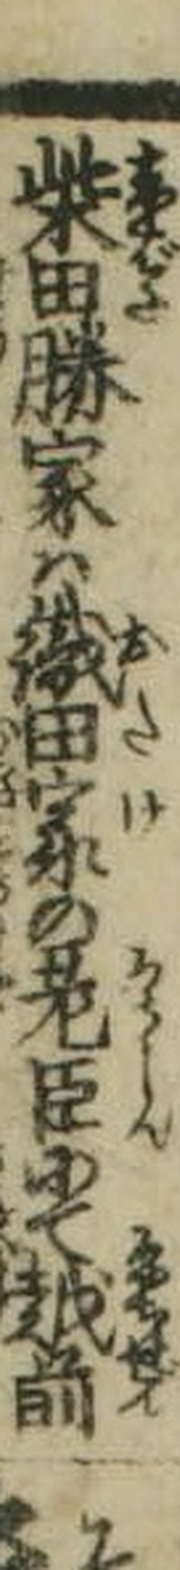柴田勝家は織田家の老臣にて越前
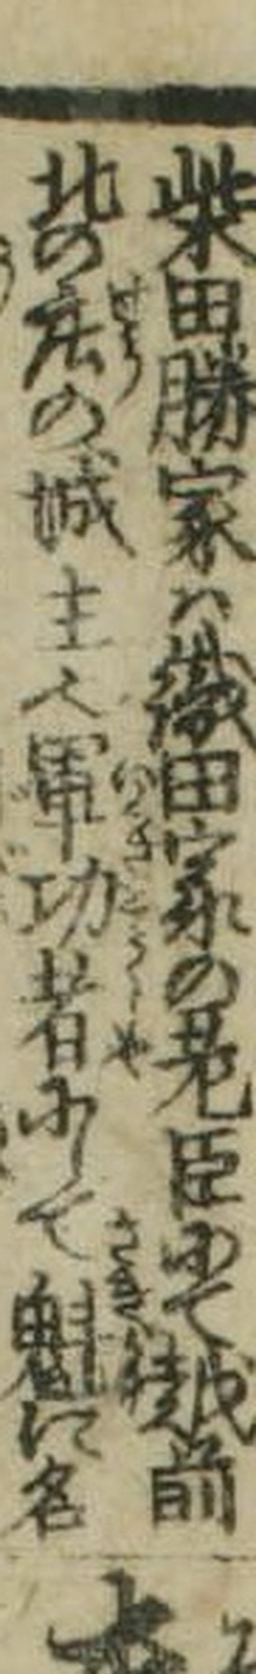北の庄の城主也軍功者にして魁に名
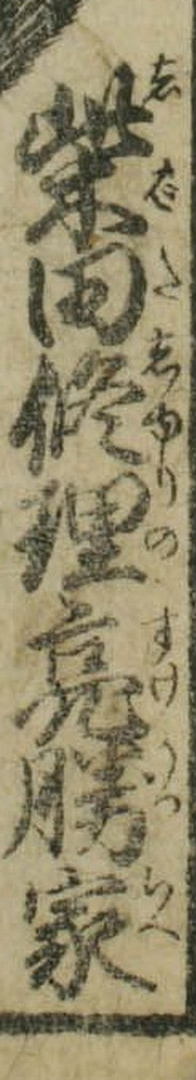柴田修理亮勝家
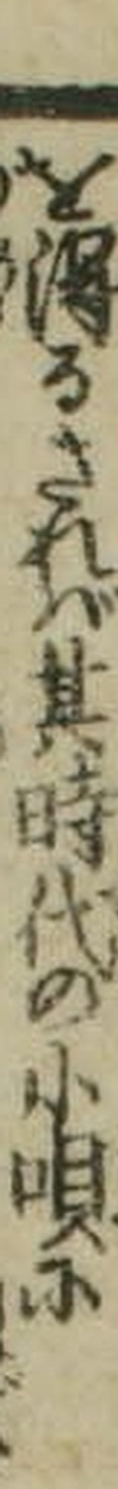を得るされば其時代の小唄に
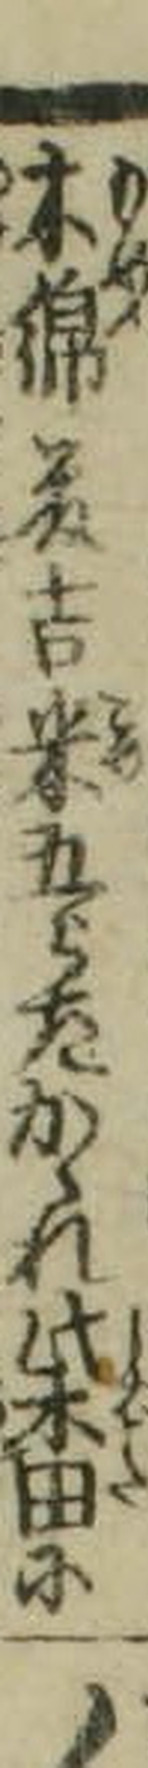木綿藤吉米五郎左かゝれ柴田に
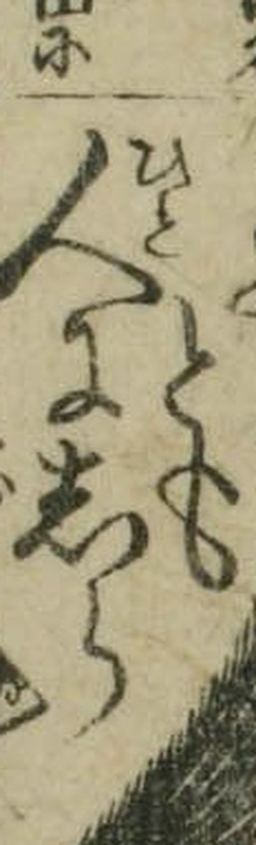人にしら
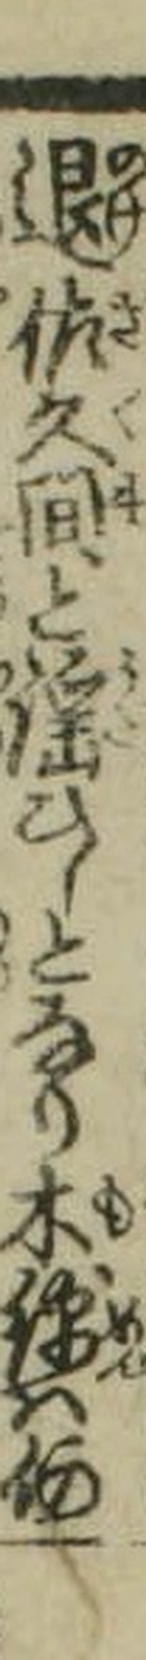退佐久間と謡ひしとなり木綿は何
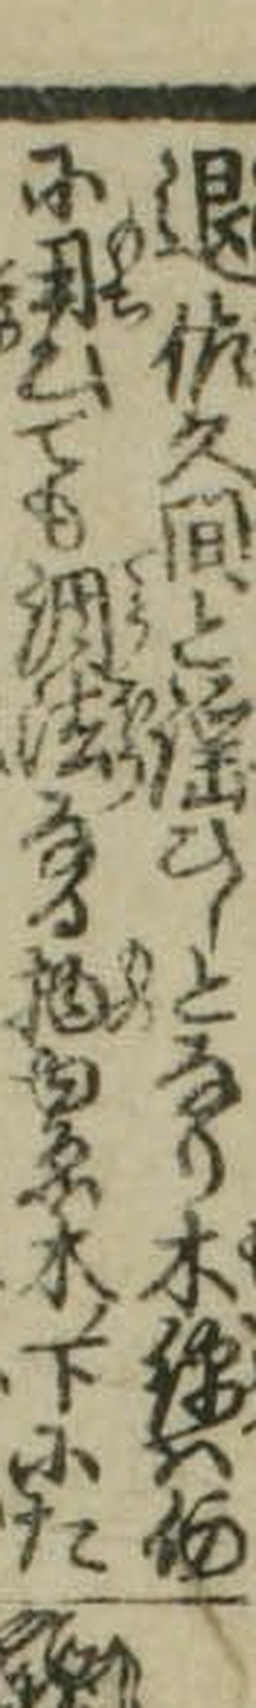に用ひても調法なる物ゆゑ木ノ下にた
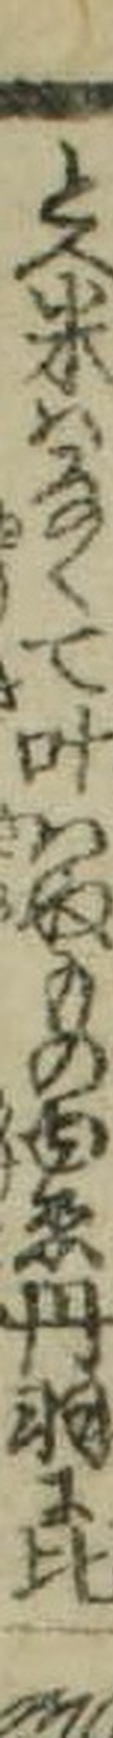とへ米はなくて叶はぬものゆゑ丹羽に比
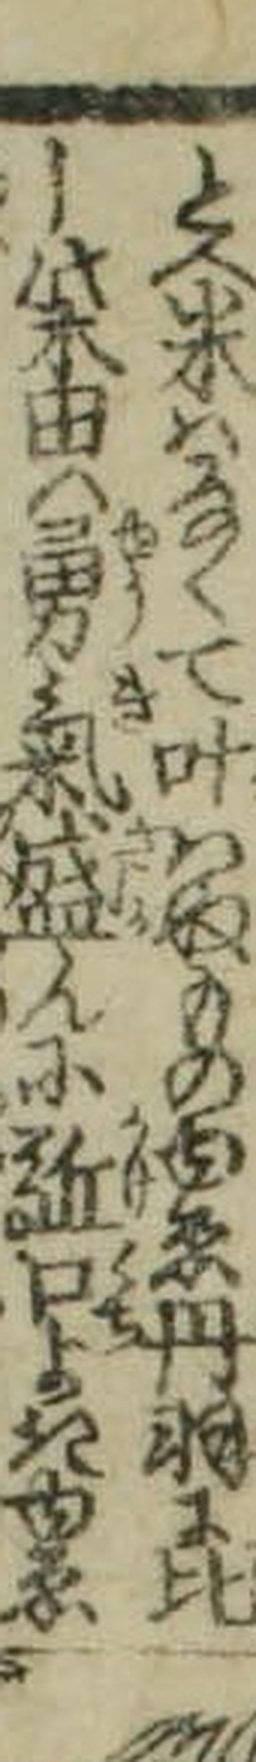し柴田は勇気盛んに駈口よきゆゑ
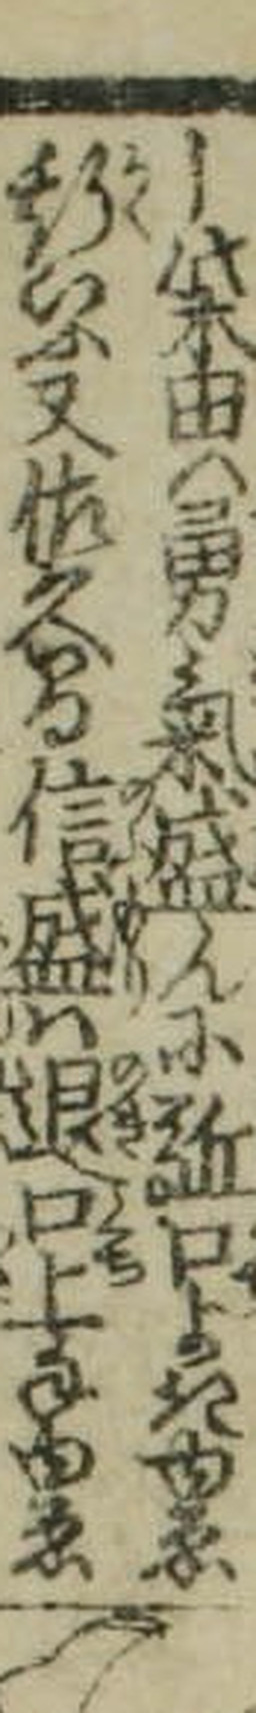斯いふ又佐久間信盛は退口上手ゆゑ
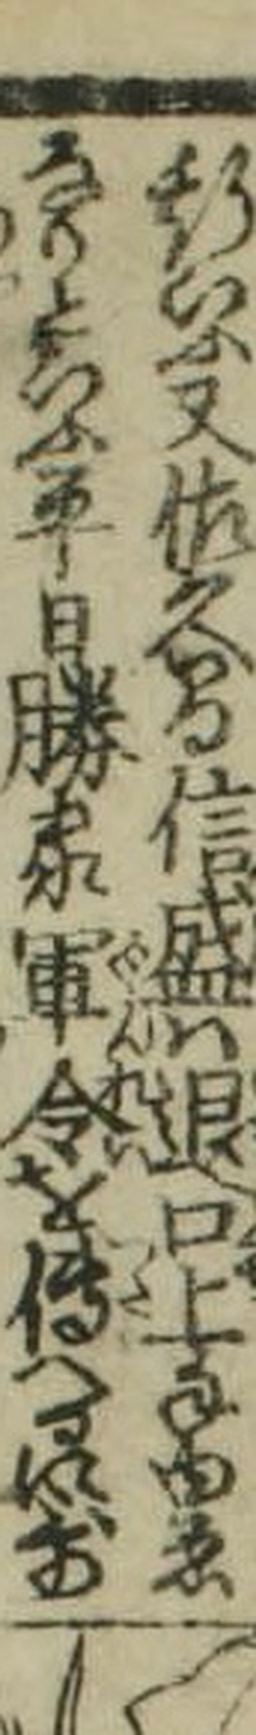なりといふ平日勝家軍令を伝へるに哥
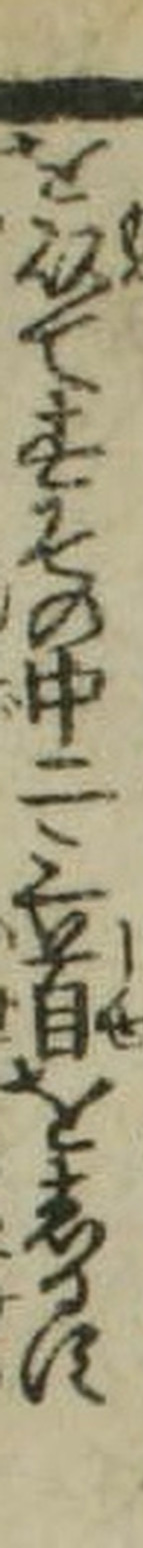を以てすその中二三首をしるす
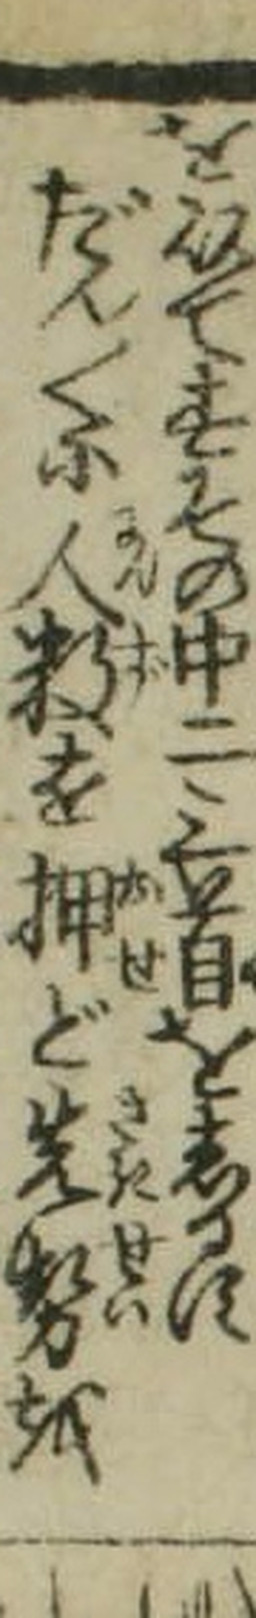だん〳〵に人数を押ど先勢を
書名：續英雄百人一首
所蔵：東京学芸大学附属図書館
